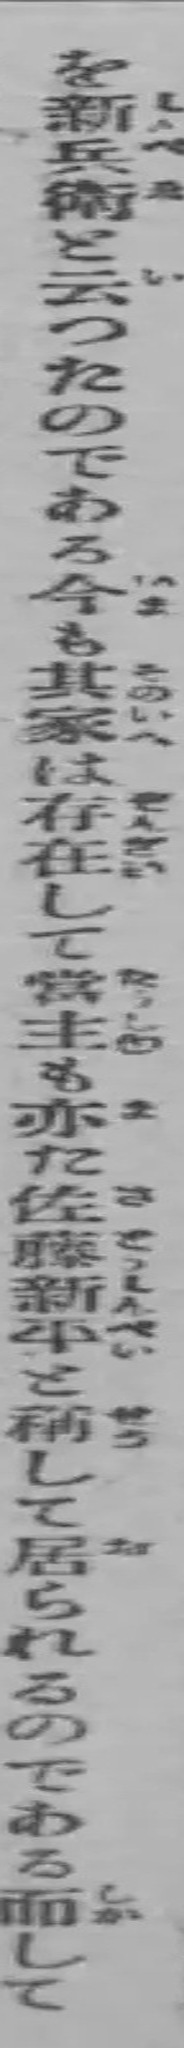を新兵衛と云つたのである今も其家は存在して当主も亦た佐藤新平と称して居られるのである而して
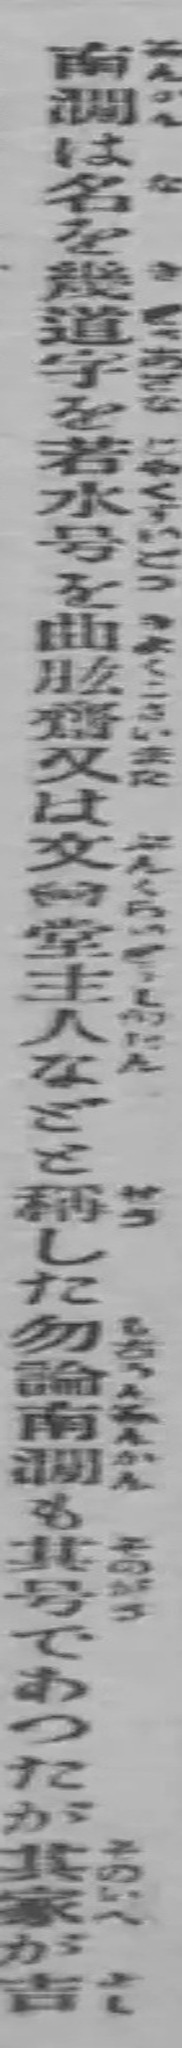南澗は名を幾道字を若水号を曲肱齋又は文会堂主人などと称した勿論南澗も其号であつたが其家が吉
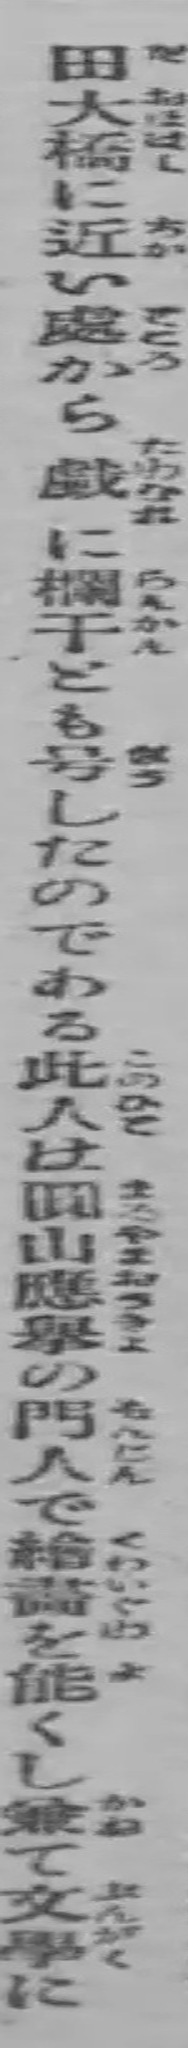田大橋に近い処から戯に欄干とも号したのである此人は円山応挙の門人で絵画を能くし兼て文学に
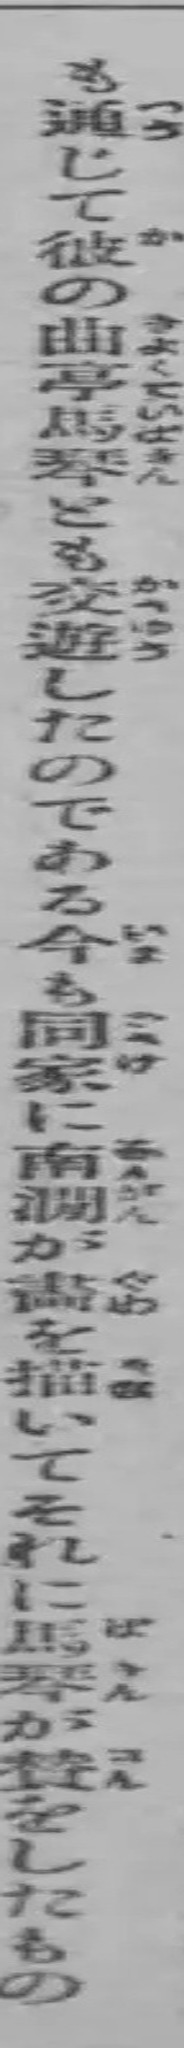も通じて彼の曲亭馬琴とも交遊したのである今も同家に南澗が画を描いてそれに馬琴が賛をしたもの
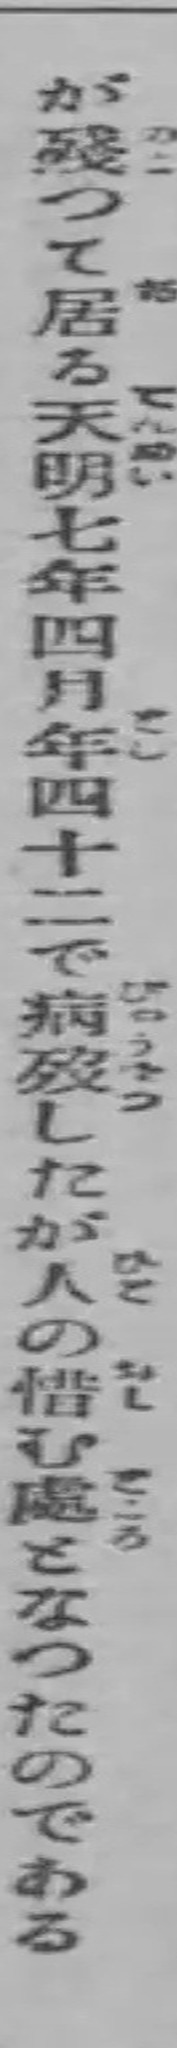が残つて居る天明七年四月年四十二で病歿したが人の惜む処となつたのである
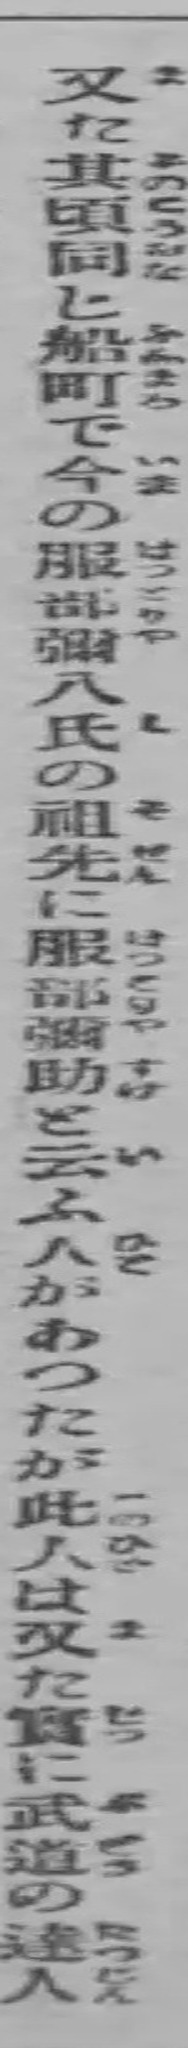服部彌助又た其頃同じ船町で今の服部彌八氏の祖先に服部彌助と云ふ人があつたが此人は又た実に武道の達人
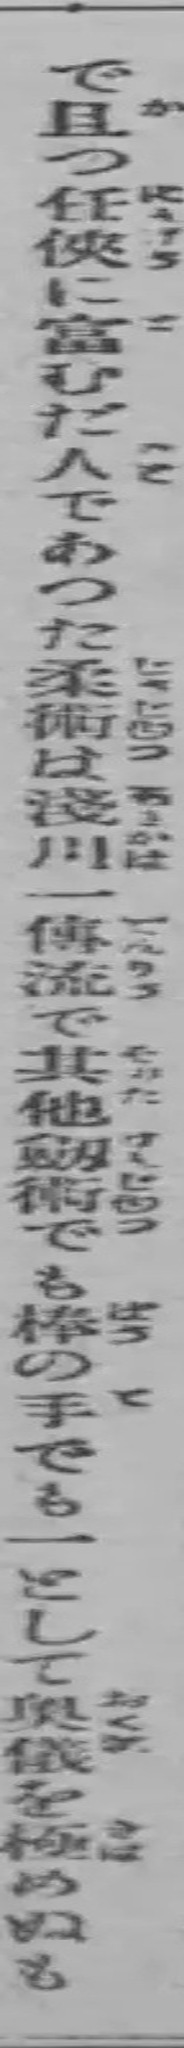で且つ任侠に富むだ人であつた柔術は浅川一伝流で其他釼術でも棒の手でも一として奥義を極めぬも
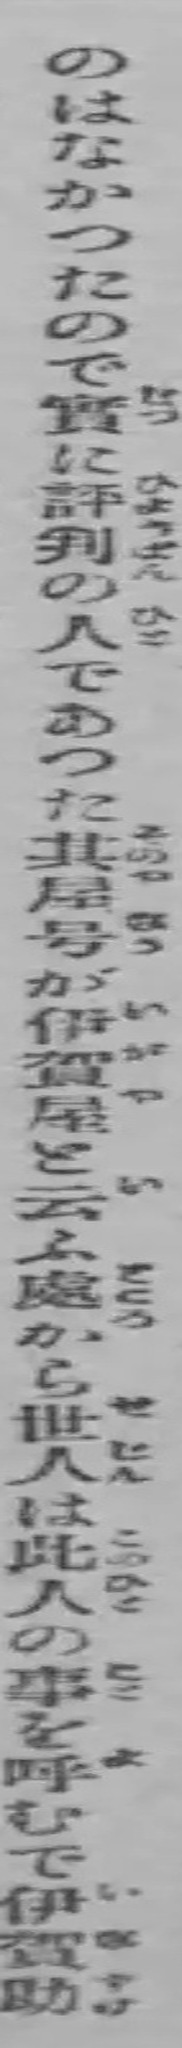のはなかつたので実に評判の人であつた其屋号が伊賀屋と云ふ処から世人は此人の事を呼むで伊賀助
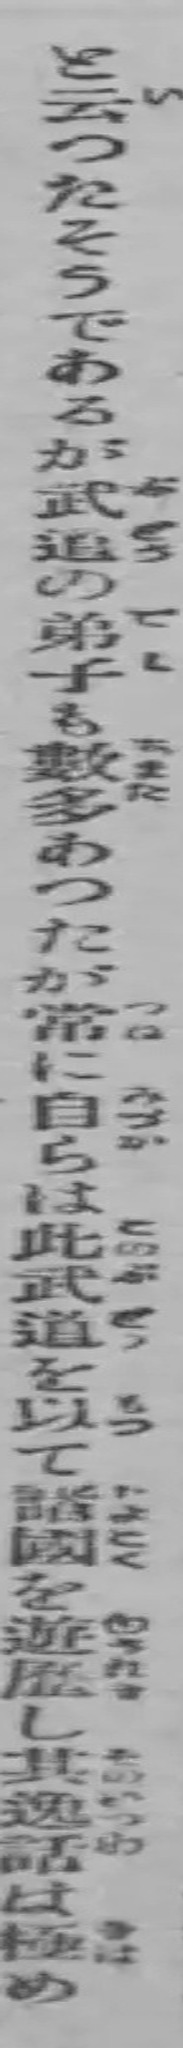と云つたそうであるが武道の弟子も数多あつたが常に自らは此武道を以て諸国を遊歴し其逸話は極め
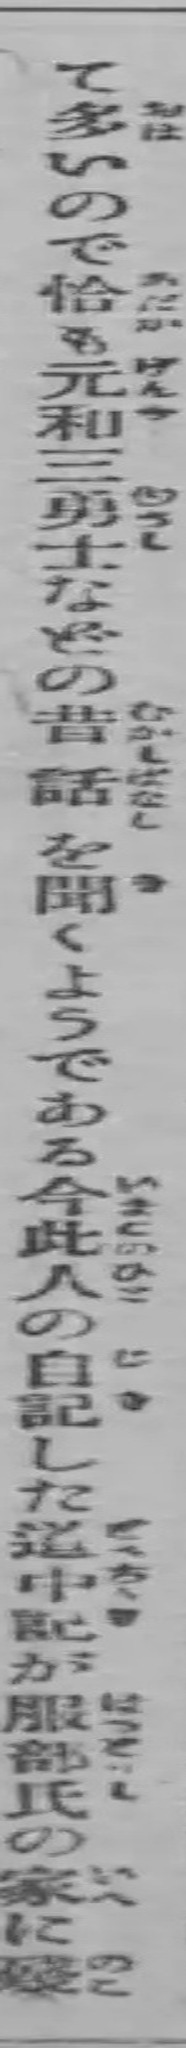て多いので恰も元和三勇士などの昔話を聞くようである今此人の自記した道中記が服部氏の家に残
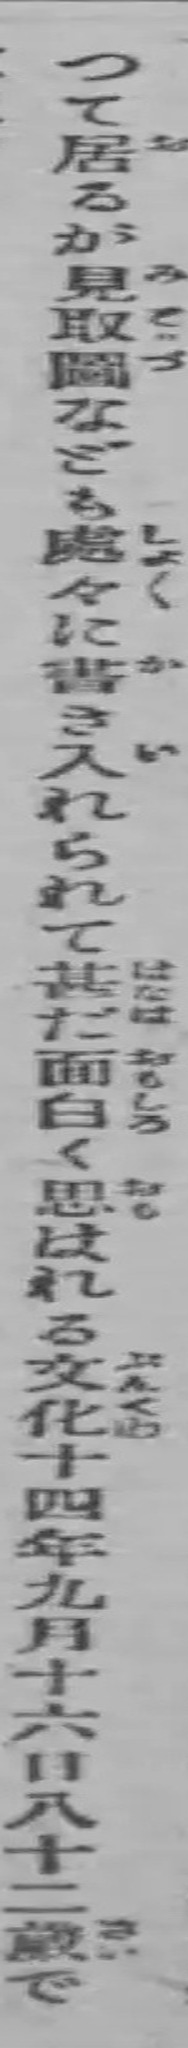つて居るが見取図なども処々に書き入れられて甚だ面白く思はれる文化十四年九月十六日八十二歳で
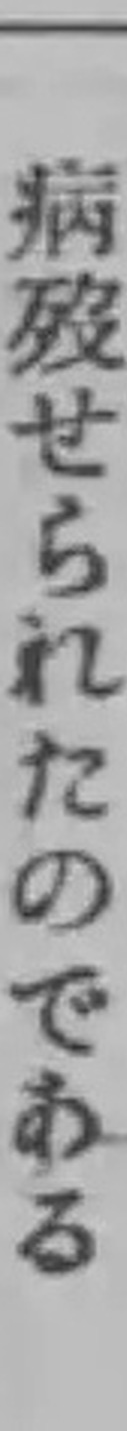病歿せられたのである
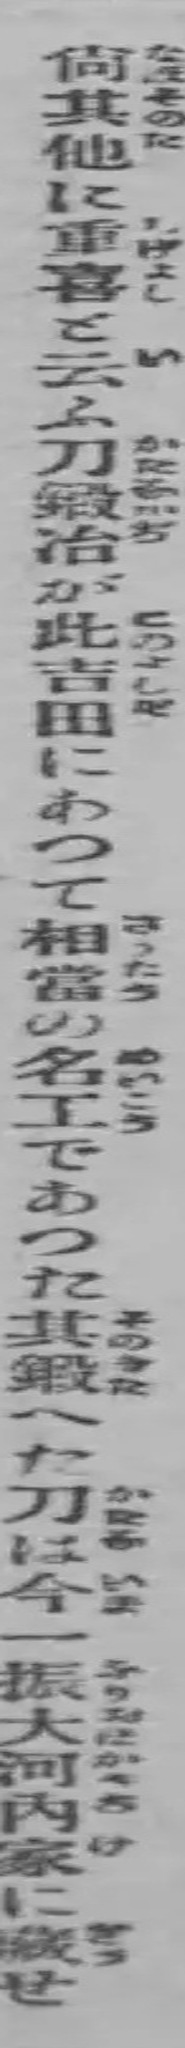刀工重喜尚其他に重喜と云ふ刀鍛冶が此吉田にあつて相当の名工であつた其鍛へた刀は今一振大河内家に蔵せ
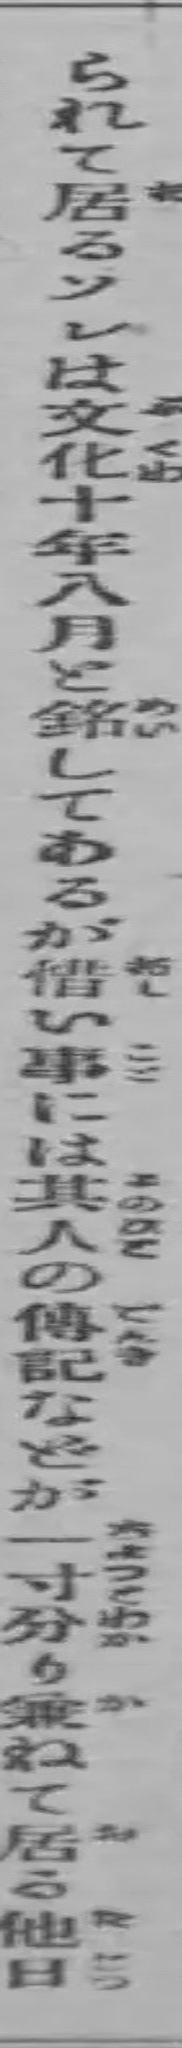られて居るソレは文化十年八月と銘してあるが惜い事には其人の伝記などが一寸分り兼ねて居る他日
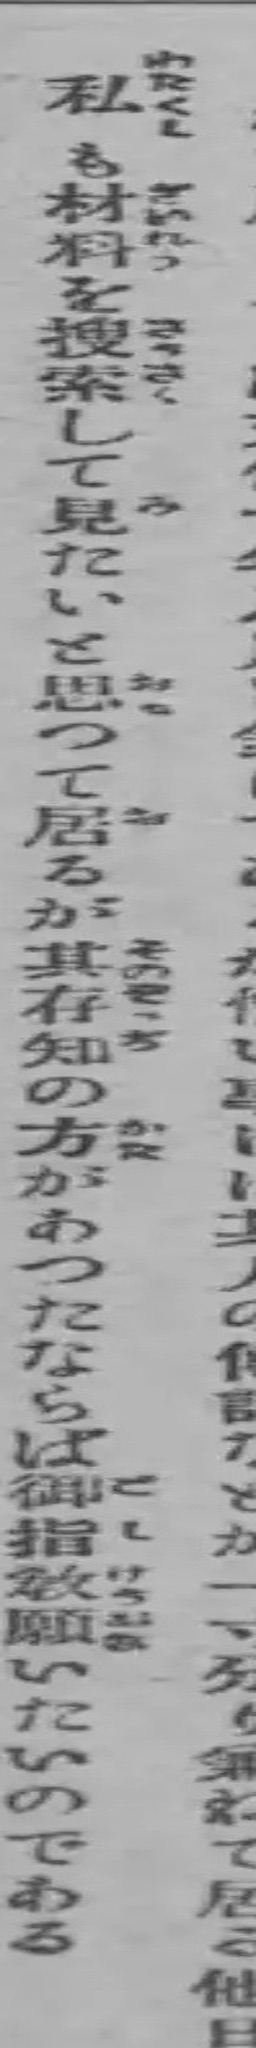私も材料を捜索して見たいと思つて居るが其存知の方があつたならば御指教願いたいのである

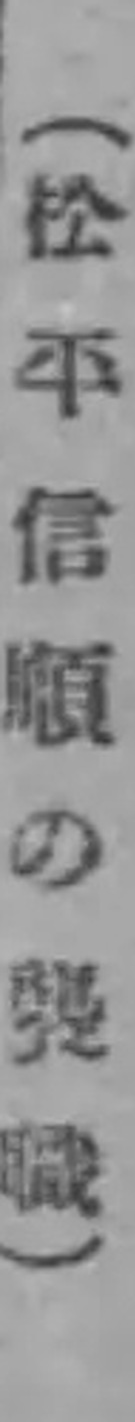⦿松平信順の襲職
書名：豊橋市史談
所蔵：国立国会図書館 National Diet Library, JAPAN
